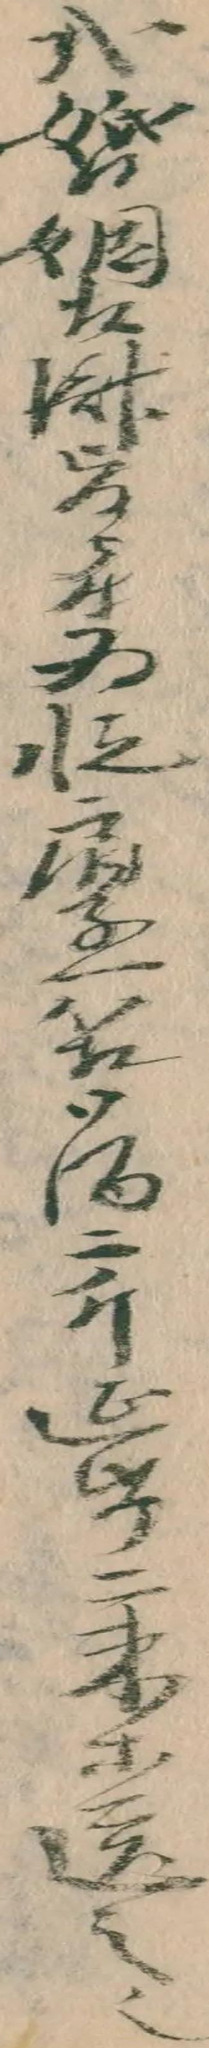引婚姻相済旨ニ付為祝扇子一箱御酒二升延季二束等送之也
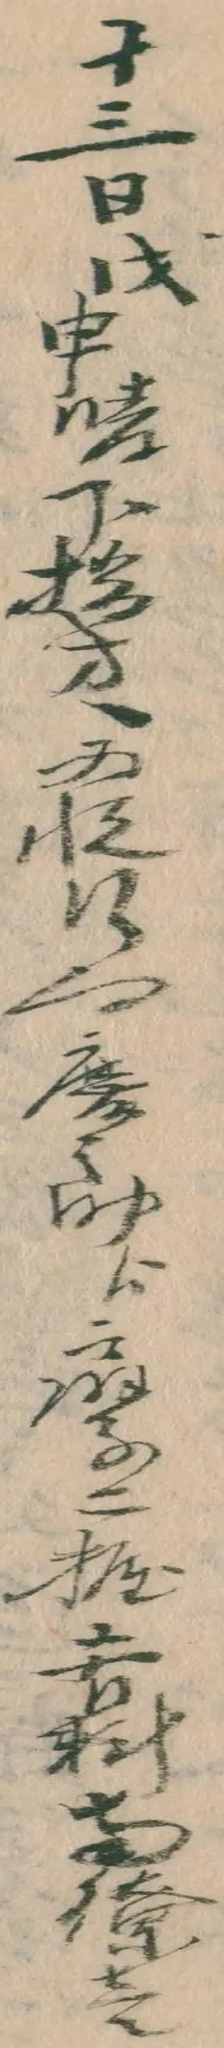十三日戊申晴下橋方へ為悦引向慶之助ゟ扇子二握肴料南鐐壱
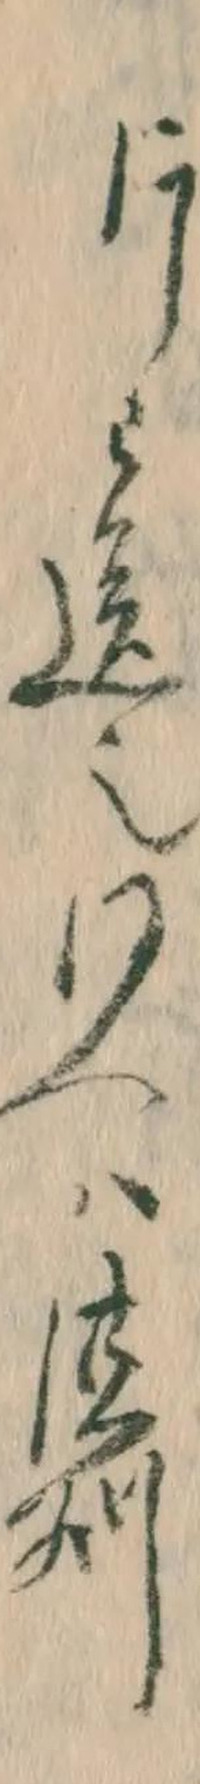片被送也同人ハ濃州
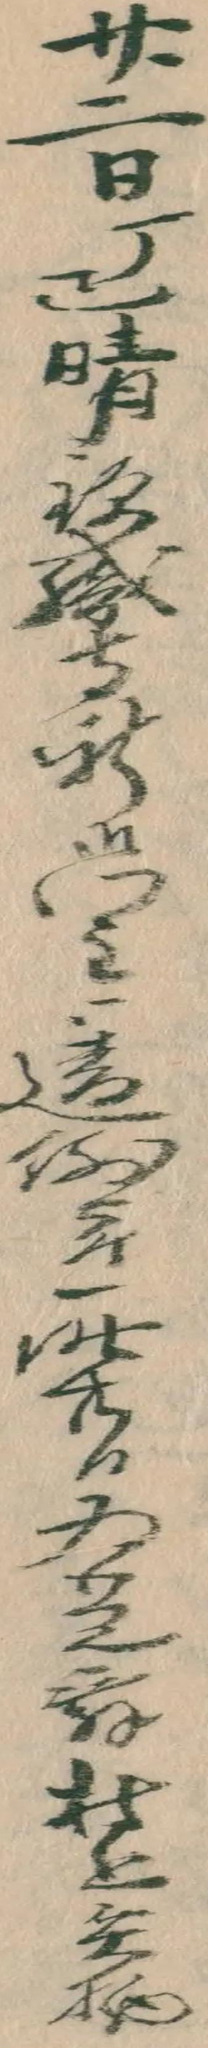廿二日丁巳晴夜織守新御門主御違例ニ付一昨廿日為覚舞村上矢柄
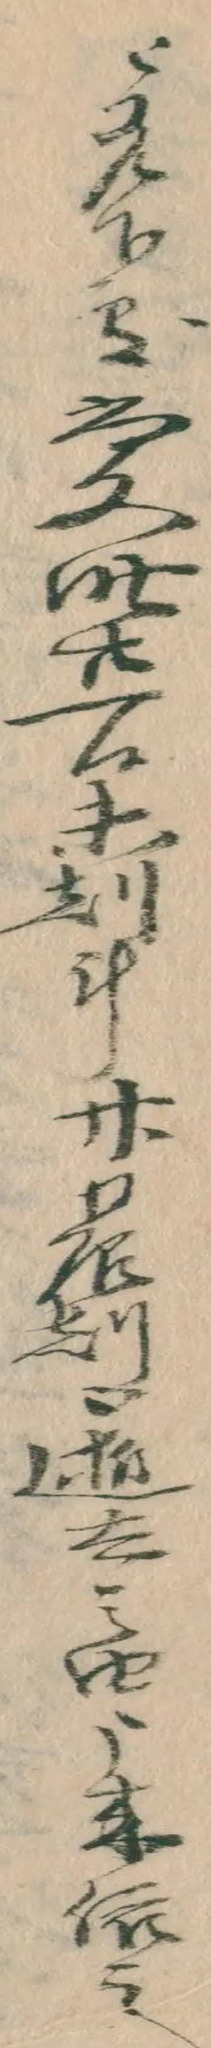被差下處尚又昨廿一日未刻斗廿日辰刻御逝去之由申来依之
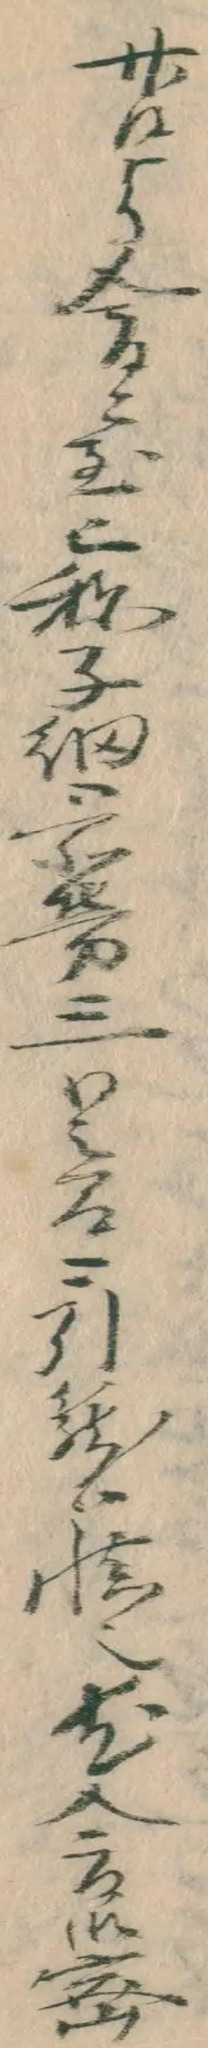廿日より今日ニ至正祢子細御所労三日之間二引越候段也尤人方御密
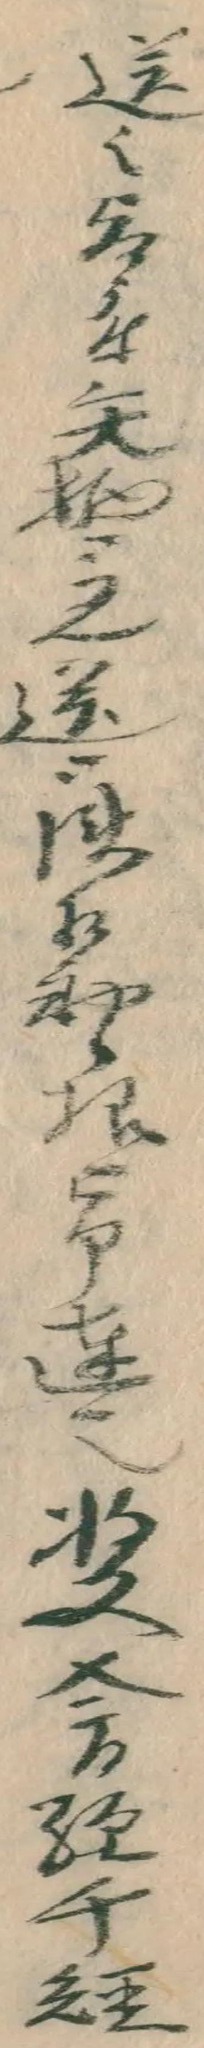送之旨ニ付矢柄御見送御供相勤候様被申達也将又五万経千経
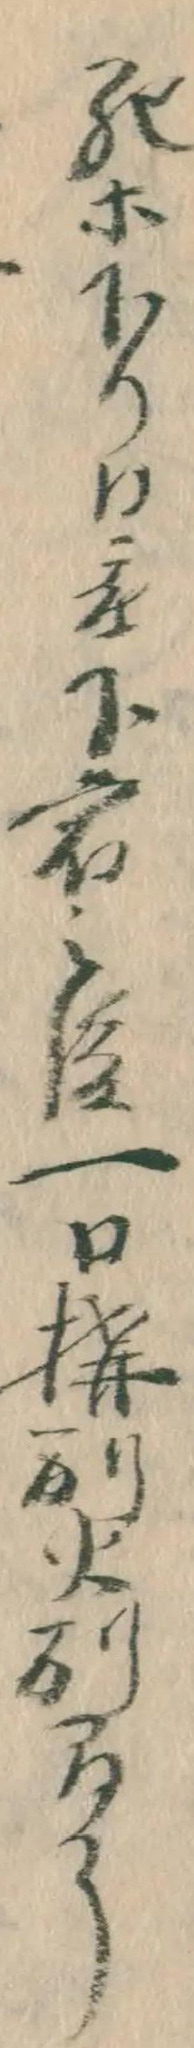啓等下り日ニ付下宿之後一日構別火別間了
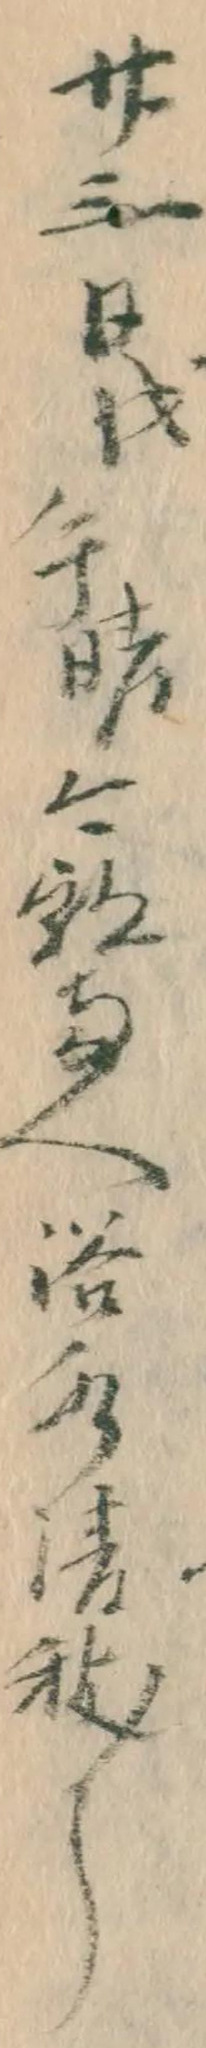廿三日戊午晴今朝両人浴水清祓了

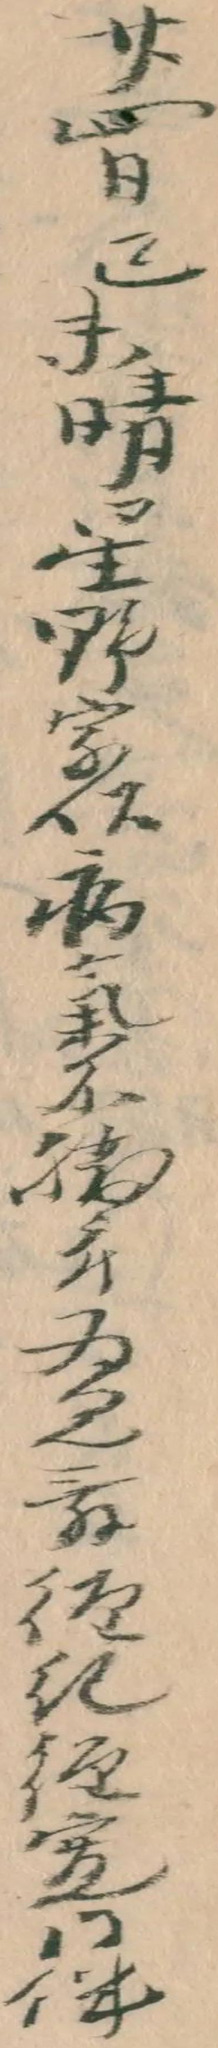廿四日己未晴星野宗以病気不勝ニ付為見舞経紀経寛同伴
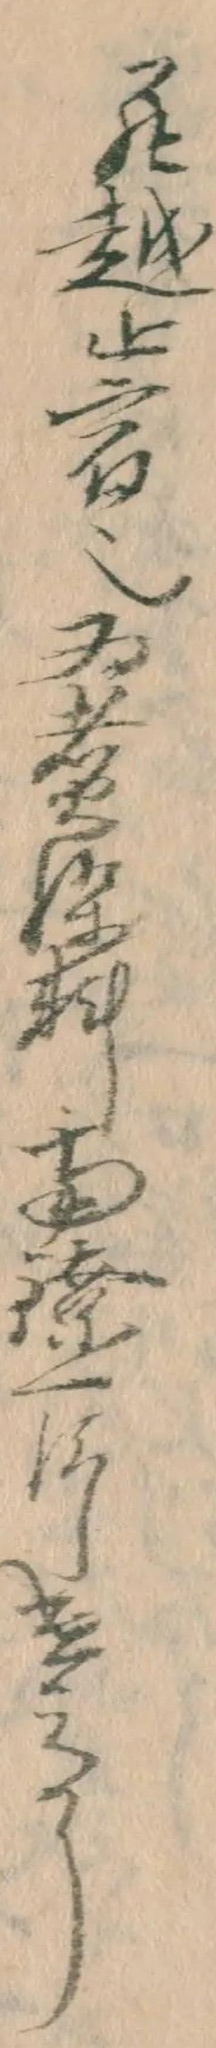罷越止宿也為煮染料南鐐一片遣之了
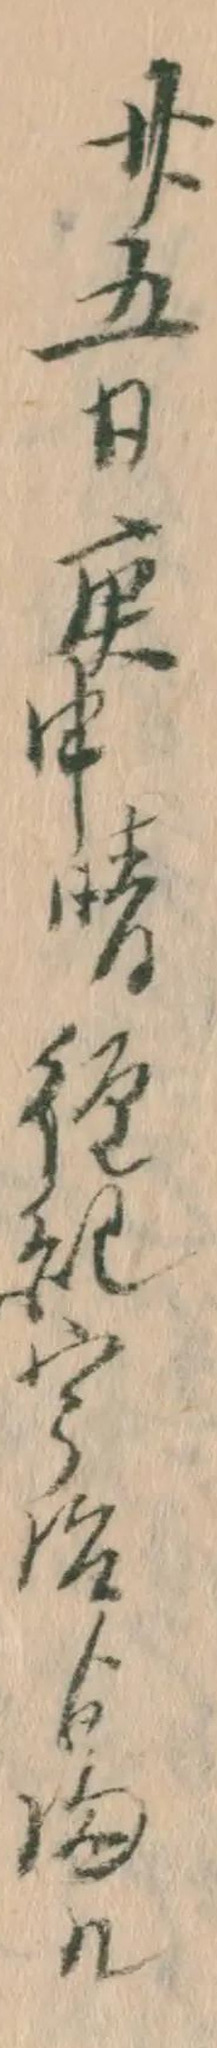廿五日庚申晴経紀宇治ゟ帰ル
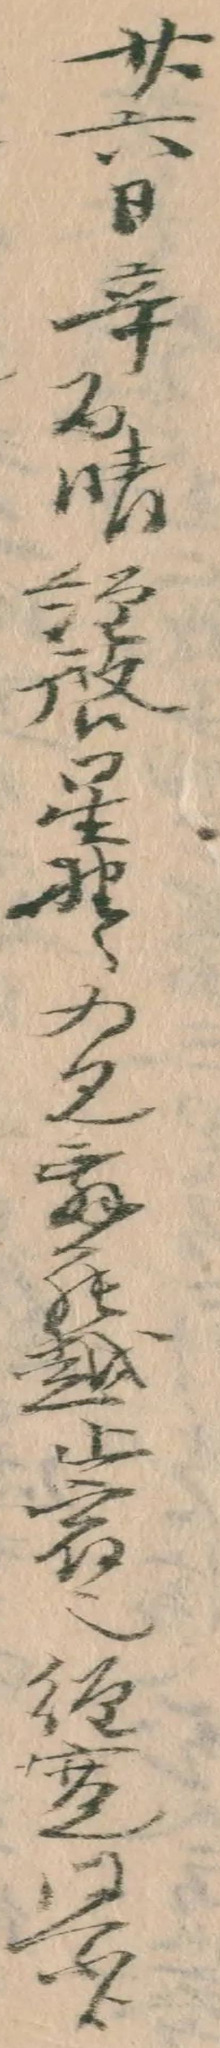廿六日辛酉晴経啓星野へ為見舞罷越止宿也経寛同所ゟ
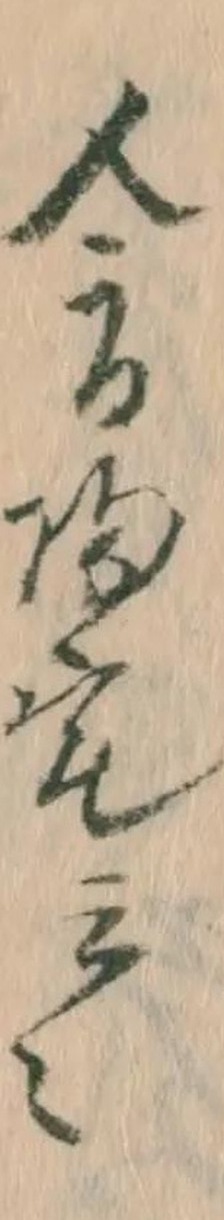今日帰宅云々
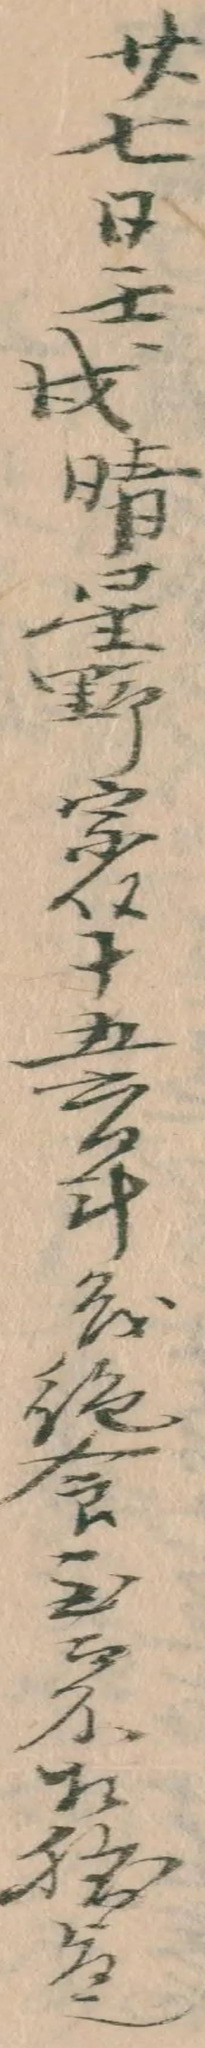廿七日壬戌晴星野宗以十五六日斗も絶食至而不相勝旨也
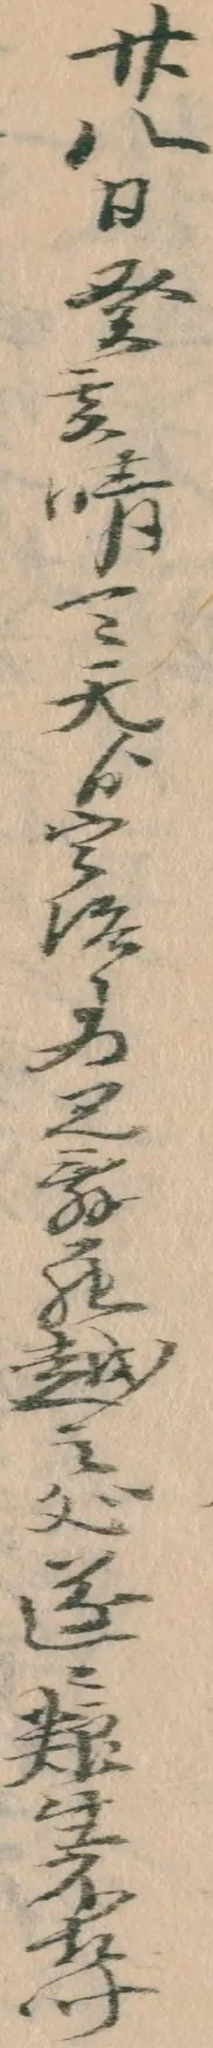廿八日癸亥晴早天ゟ宇治ヘ為見舞罷越之処遂に養生不相叶
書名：賀茂社記録. 第69冊
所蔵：国立国会図書館 National Diet Library, JAPAN
